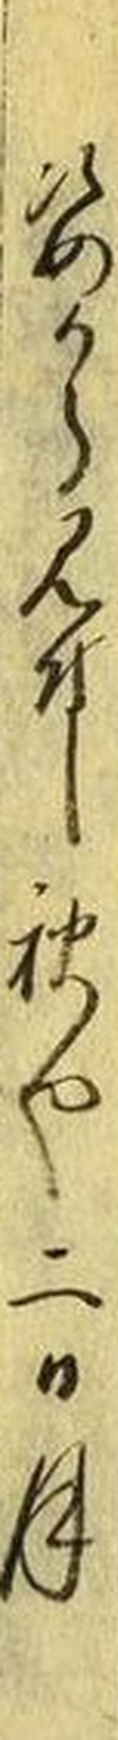姿から見付し秋や二日月
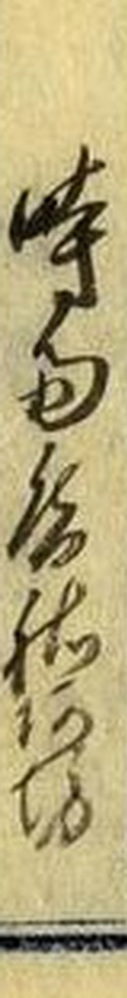時雨庵祐阿坊
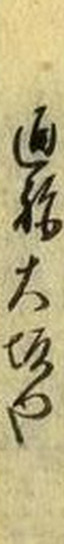通称大坂や
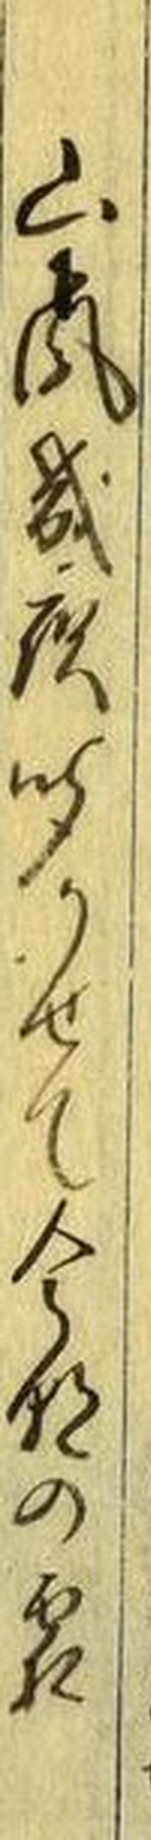山嵐幾夜聞かせて今朝の霜
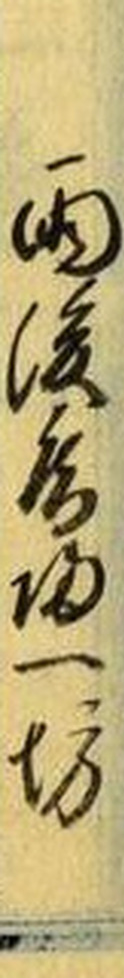雨後庵帰一坊
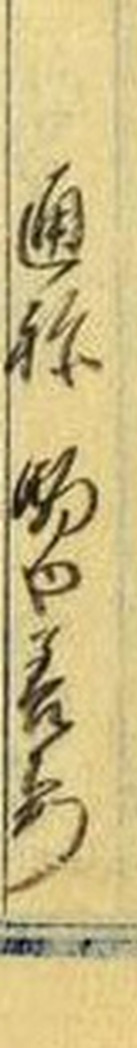通称駒や善右衛門
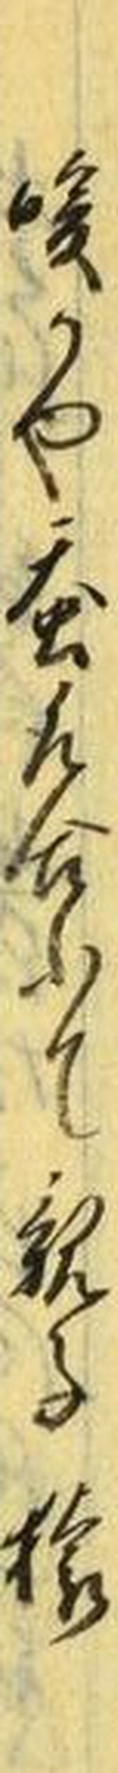暖かや蚤取合ふて親子猿

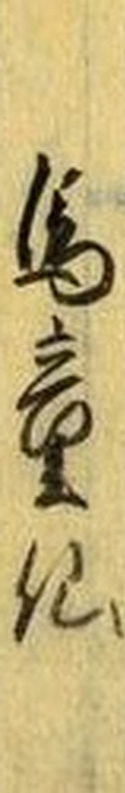馬童仙
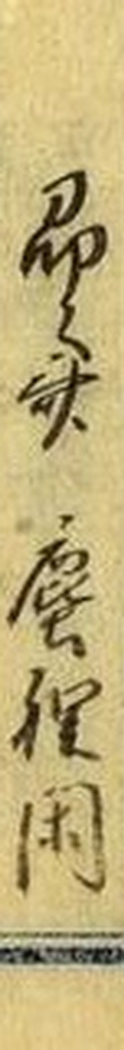州之斎塵狸閑
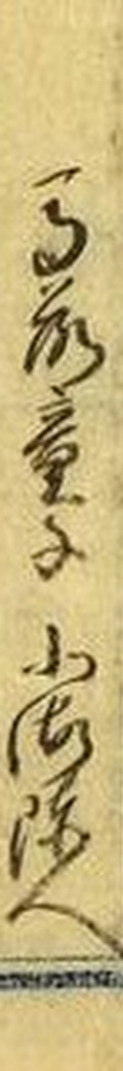馬落童子北湖隙人
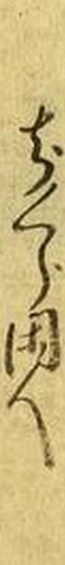ちくら閑人
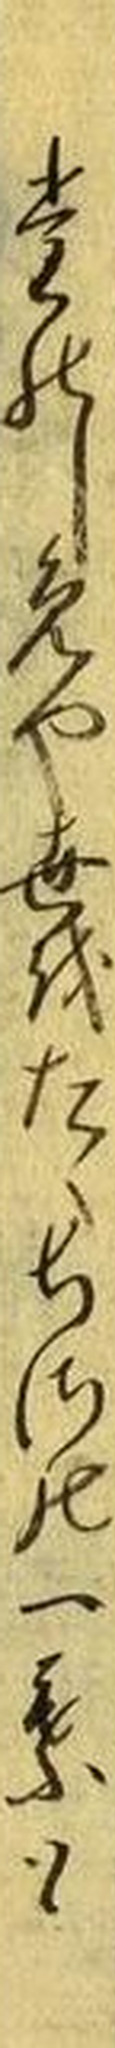たのしめや世をたゝちさの一葉も
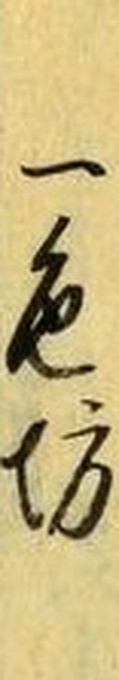一色坊
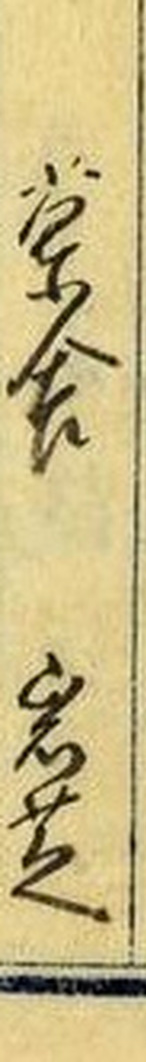堂舎岩芝
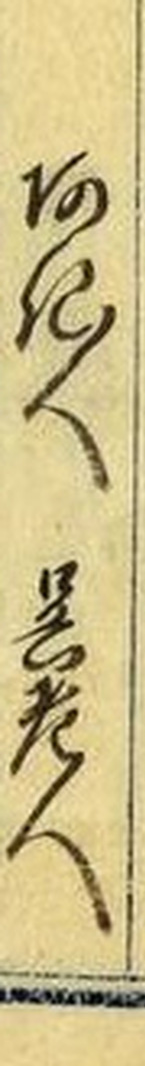可仙人呉老人
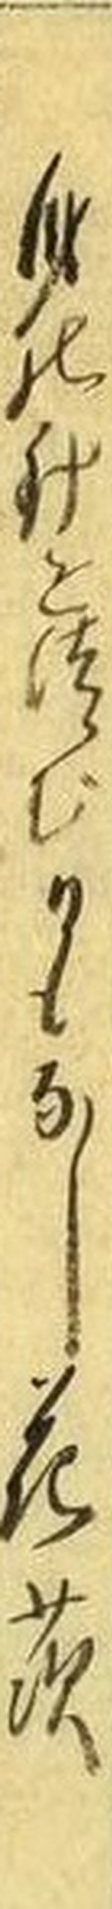身の針もつゝむけもなし花茨
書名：温古集 三巻
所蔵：福井県文書館 Fukui Prefectural Archives
